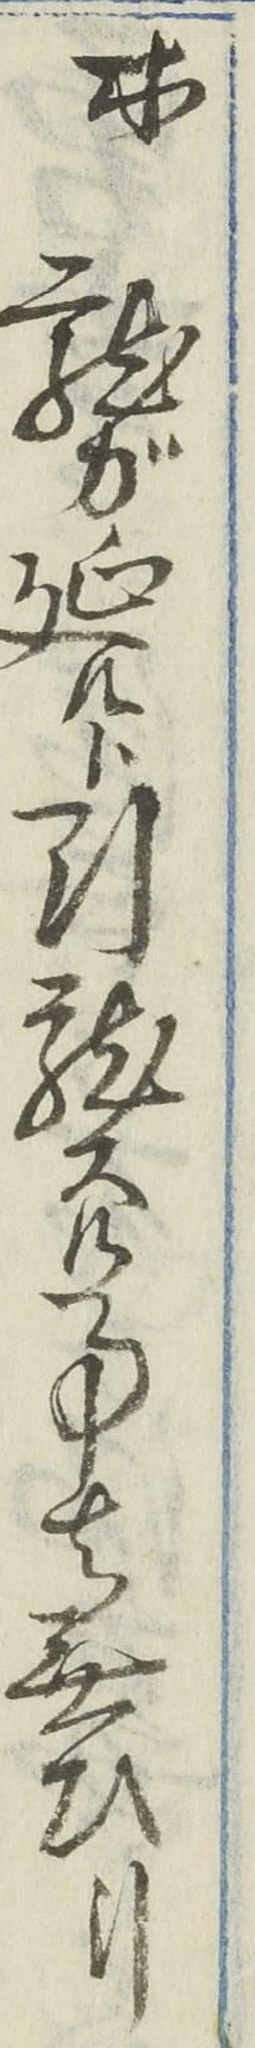木龍ガ延ルト引龍スル事ハ無ひ
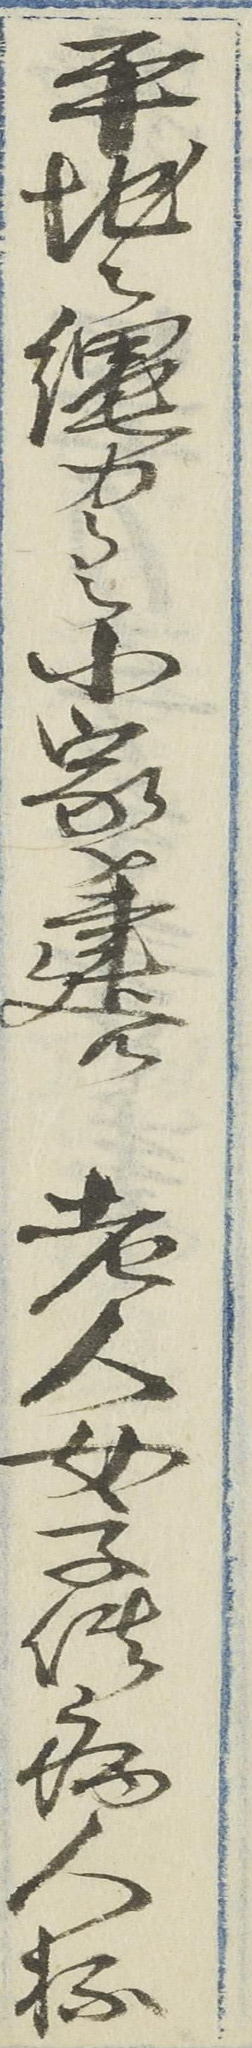平地ニ縄カらミ小家ヲ建ル老人女子供病人抔
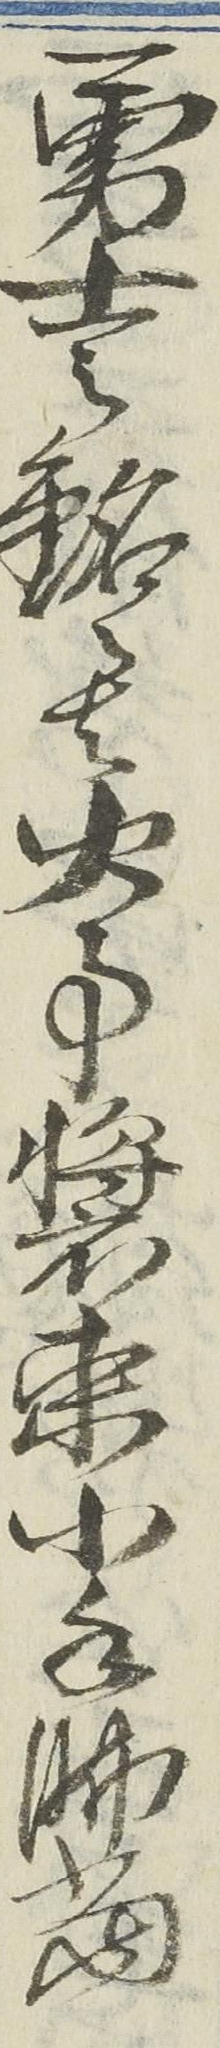勇士之銘〻ハ火事装束小手脚当
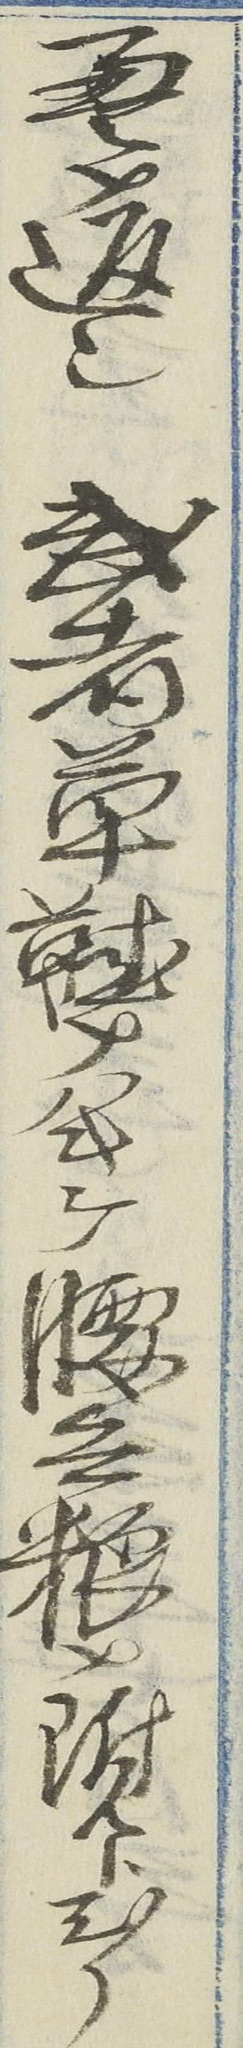畳ヲ返シ武者草鞋ヲハキテ腰兵粮ヲ附ルト云ウ
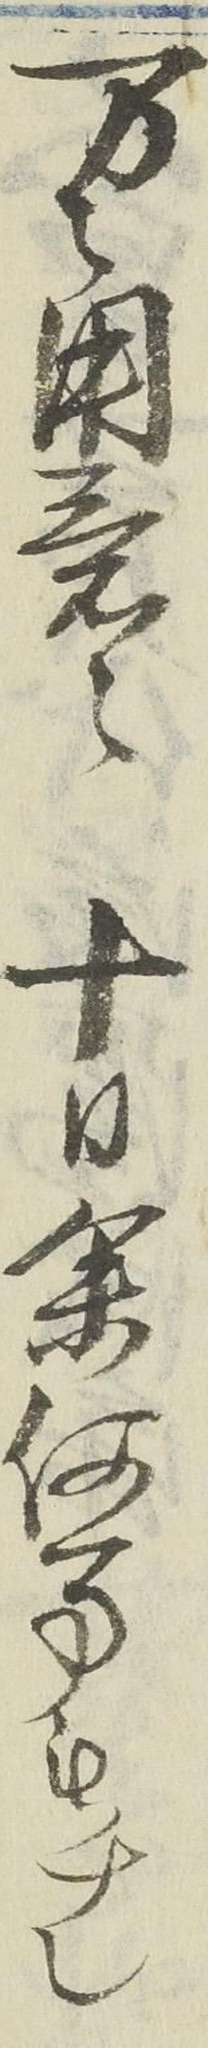万之用意之十日余何事モナシ

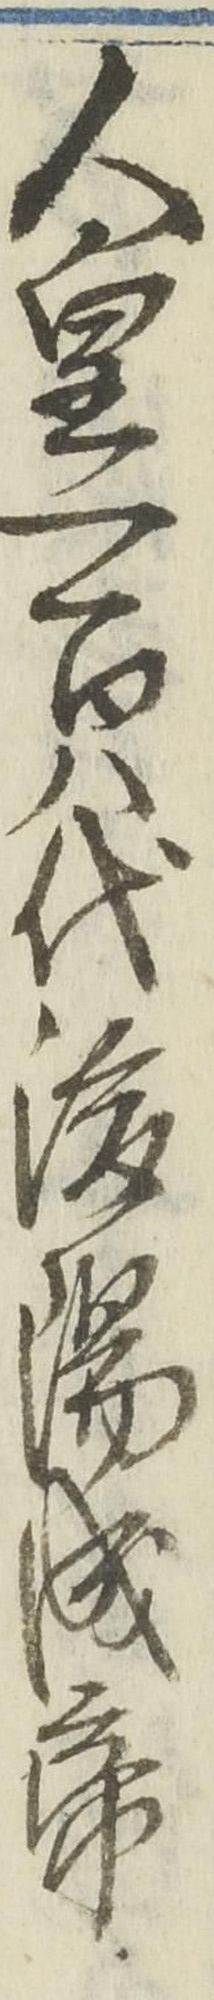人皇帝一百八代後陽成帝
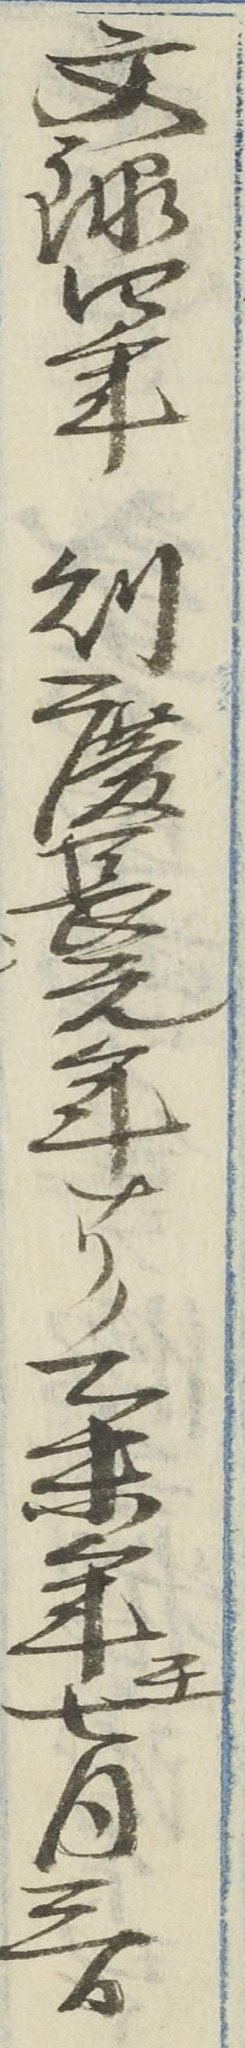文禄四年則慶長元年ナリノ乙未年壬七月三日
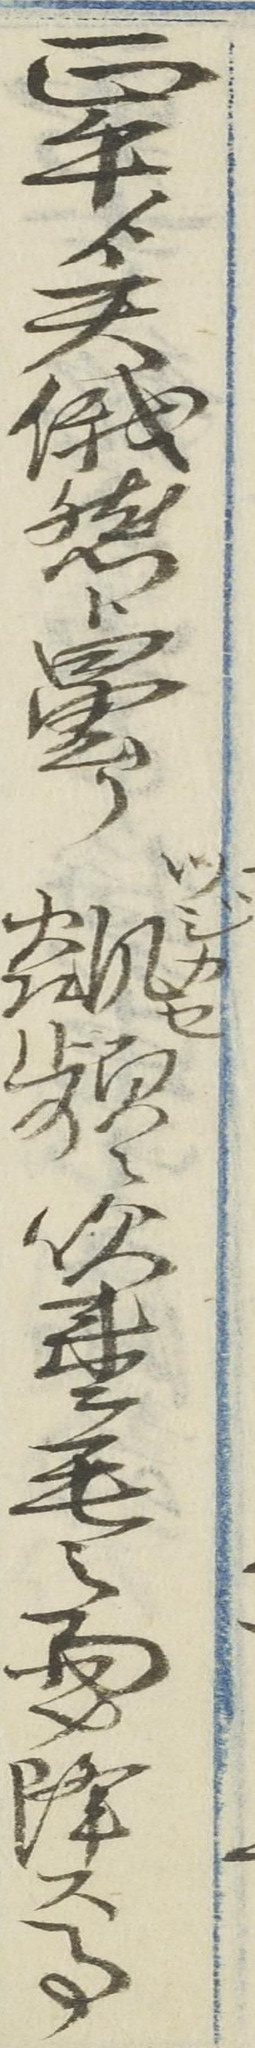正午ゟ天俄然ト曇リ飊頻ニ吹来テ毛之雨ヲ降ス事
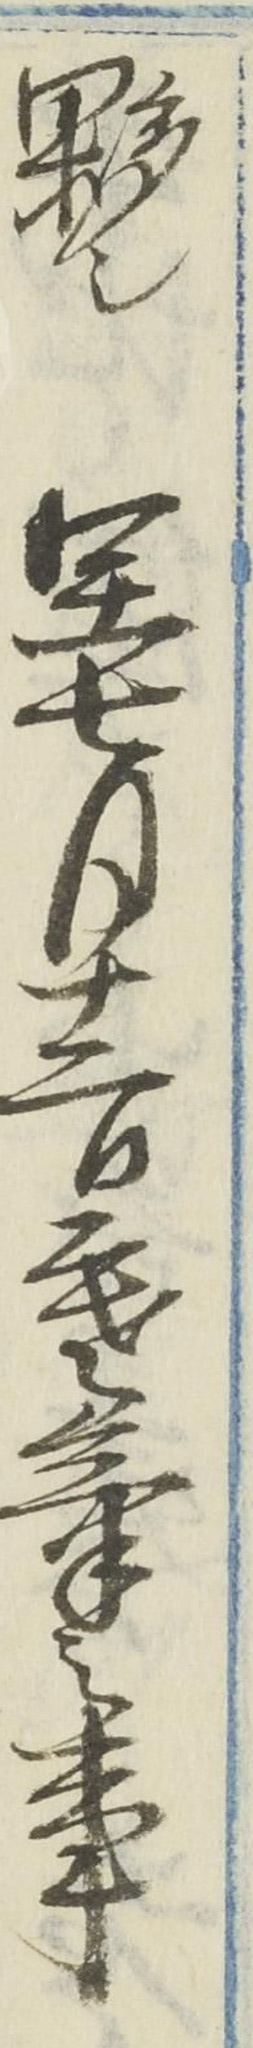夥シ閏七月十二日寒氣之事
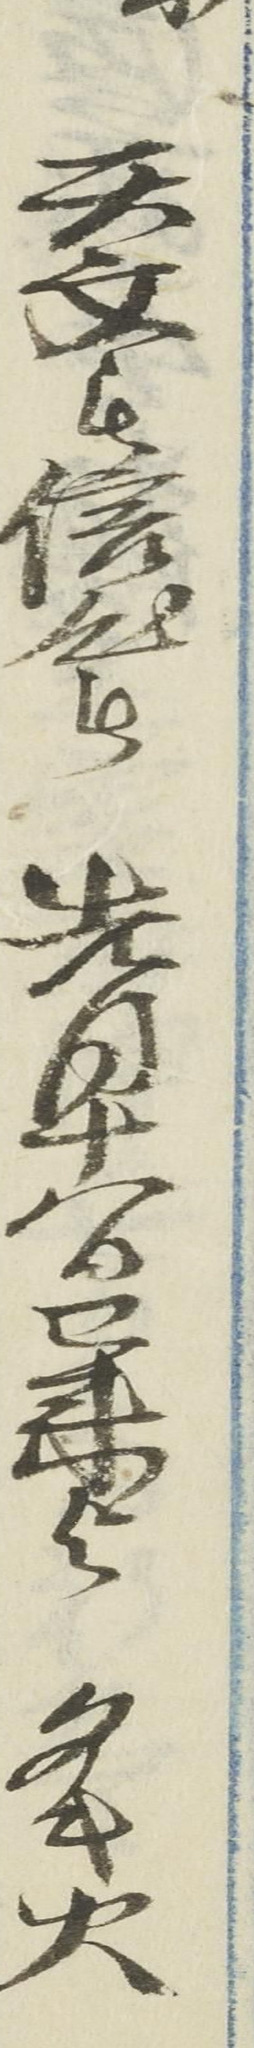木天文モ信心モ先月十八日已来トタキ火
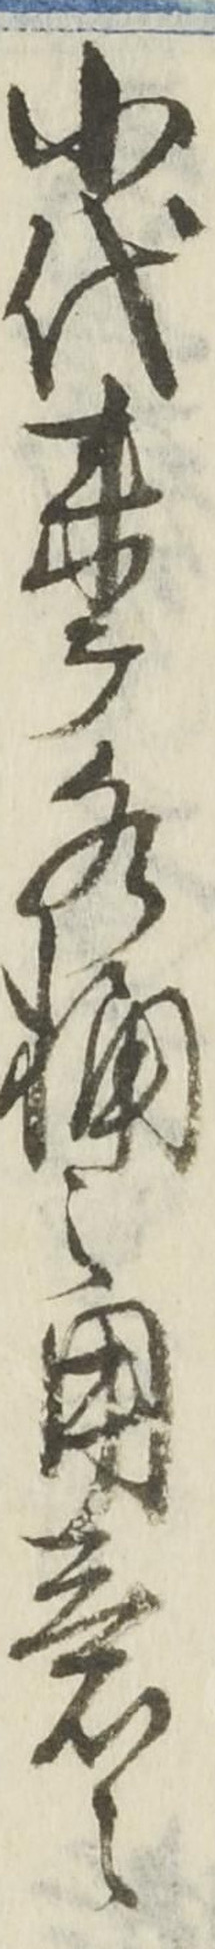小代来テ水桶之用意之
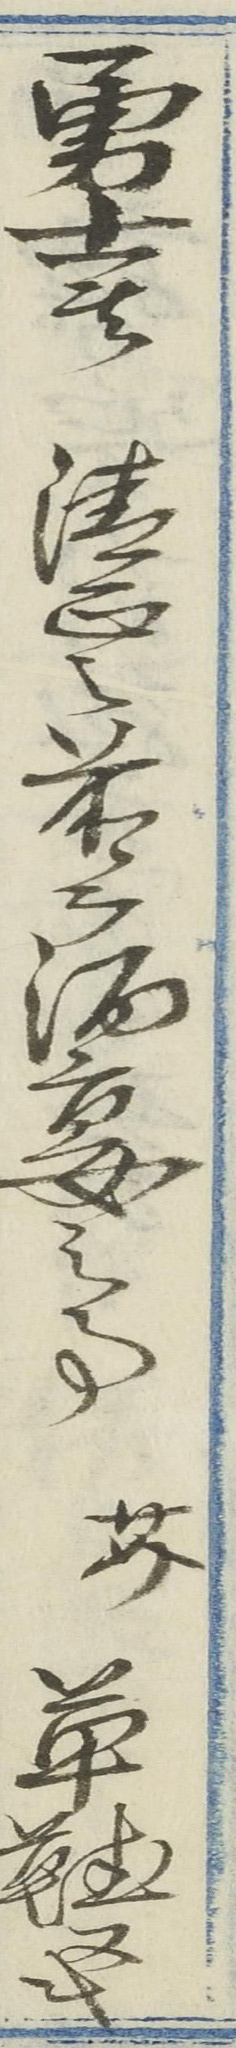勇士共清正之前テ酒宴之事芥草鞋ヌキ
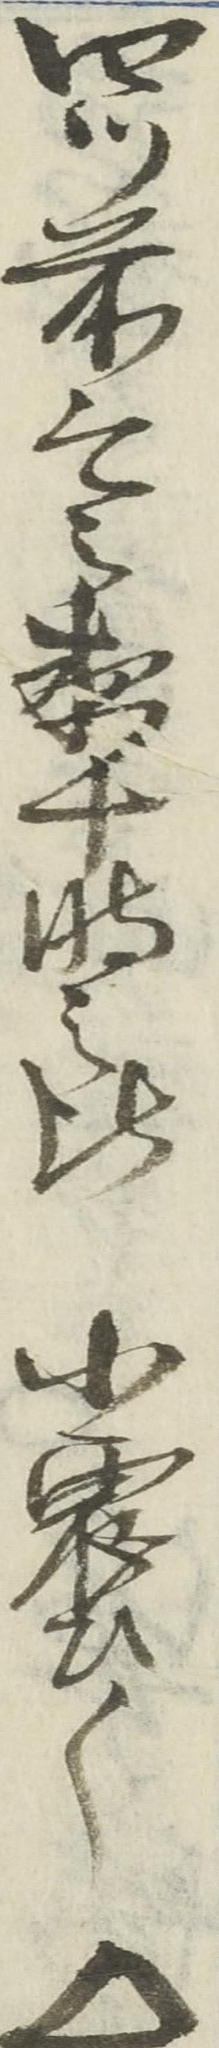四ツ前今之夜十時之比小震ひ〳〵△
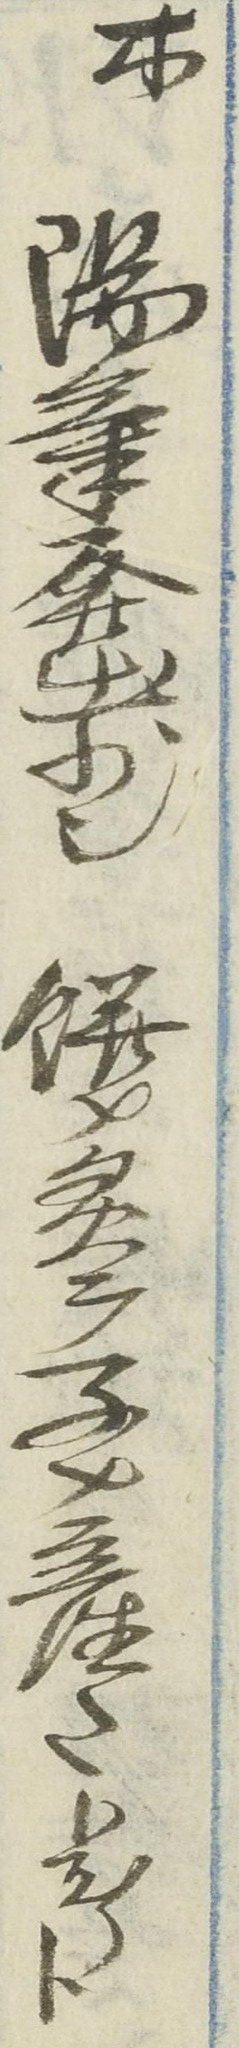木陽氣発出少シ餅ヲ炙テ子ヲ産タト云ウト
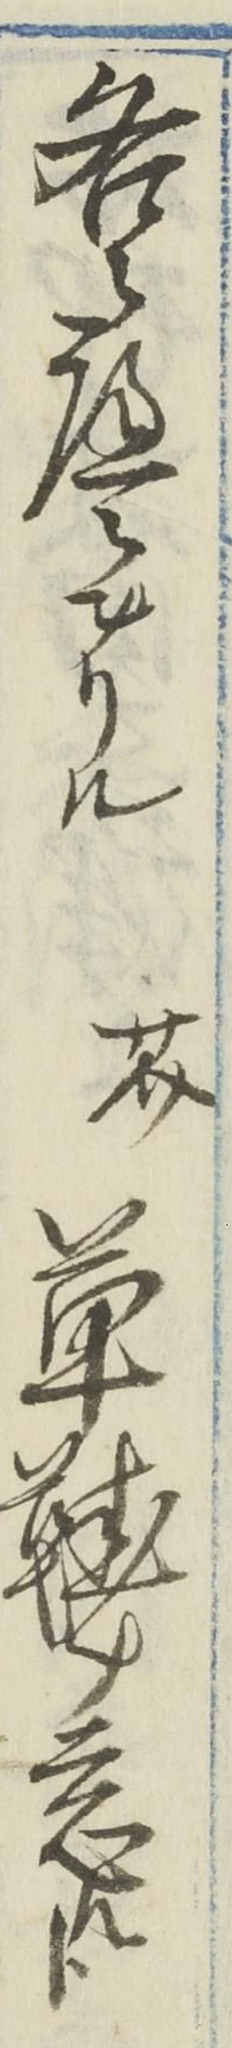各々庭ニヲリル芥草鞋ヲ忘ルト
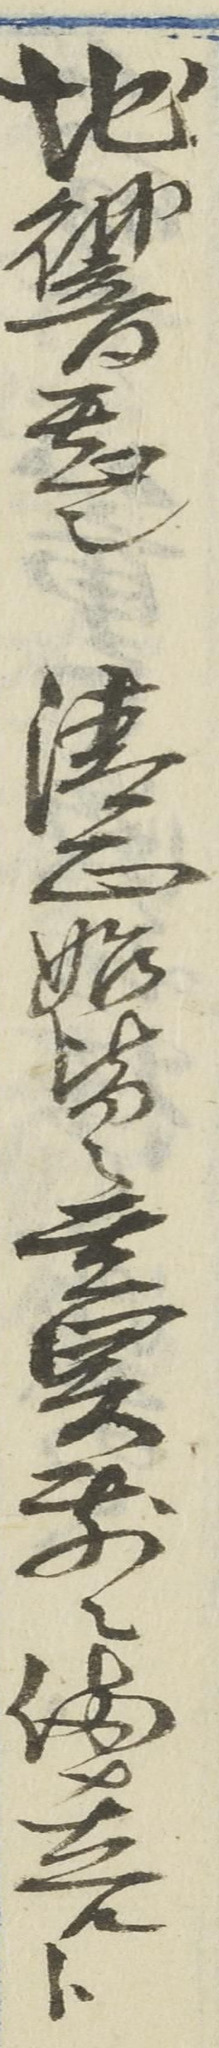地響甚シ清正始皆々玄関前ニ備ヲ立ルト
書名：伏水大地震
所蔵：東京大学地震研究所図書室 Earthquake Research Institute Library, The University of Tokyo, JAPAN
